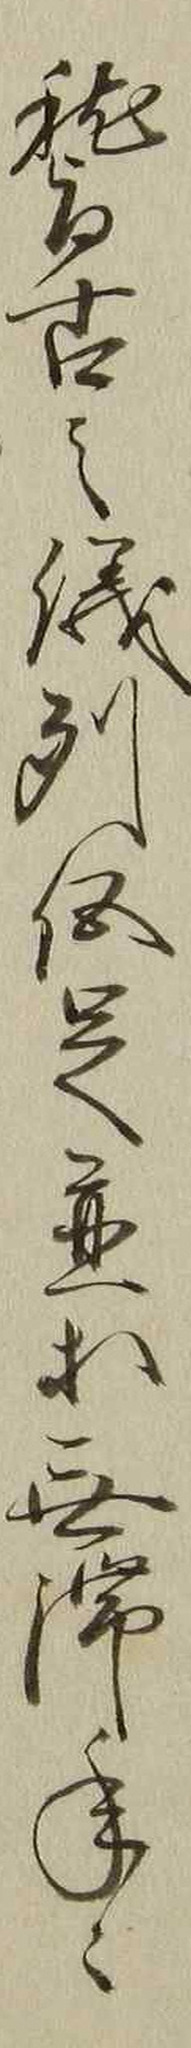稽古之儀列伍足並等無滞年々
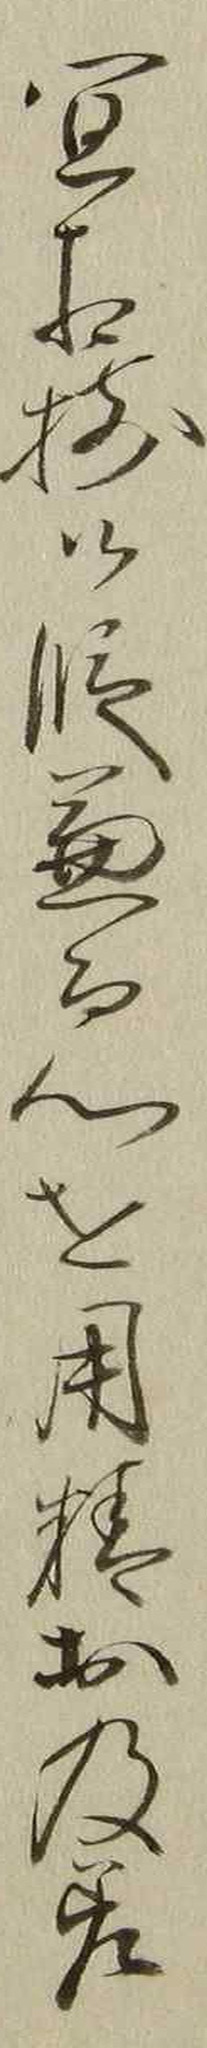宜相揃候段兼而心を用精出及差
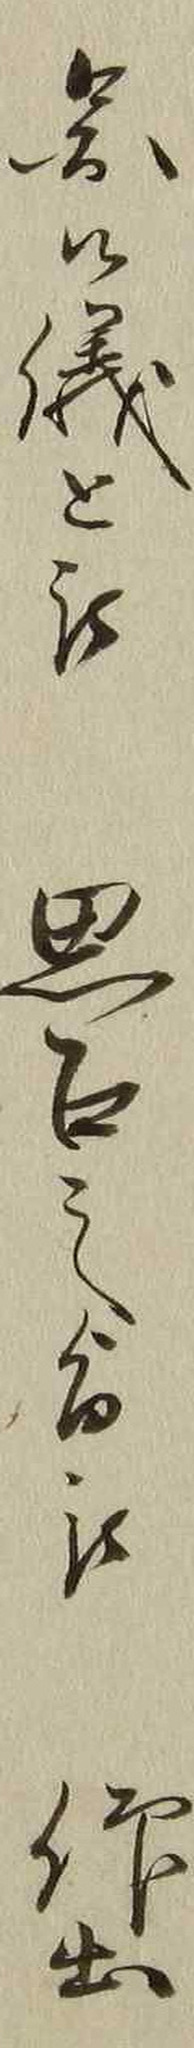図候儀と被思召之旨被仰出
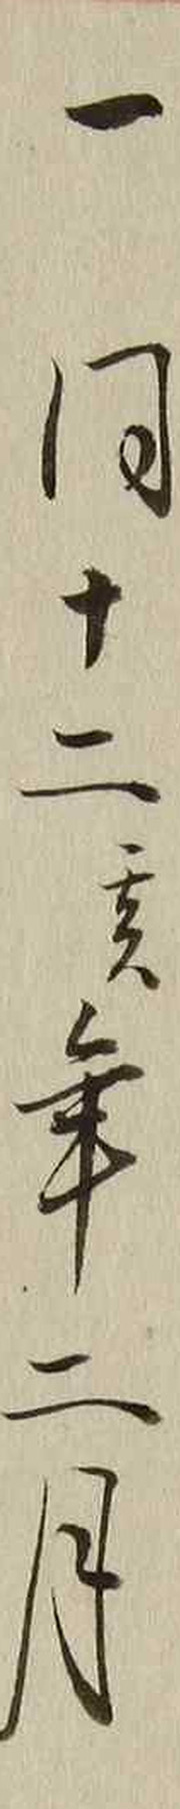一同十二亥年二月
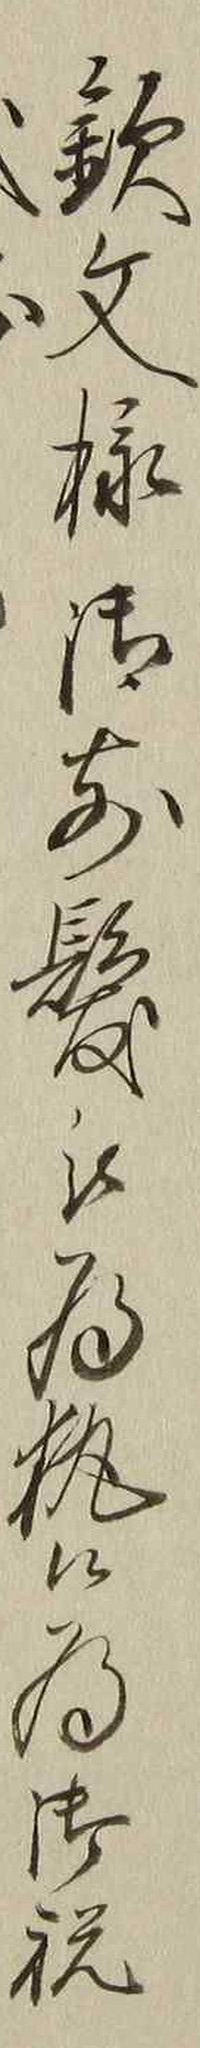欽文様御前髪被為執候為御祝
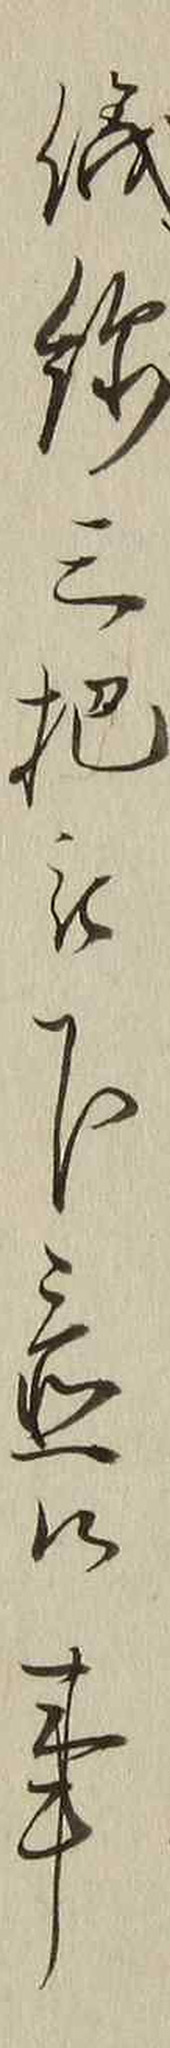儀綿三把被下置侯事
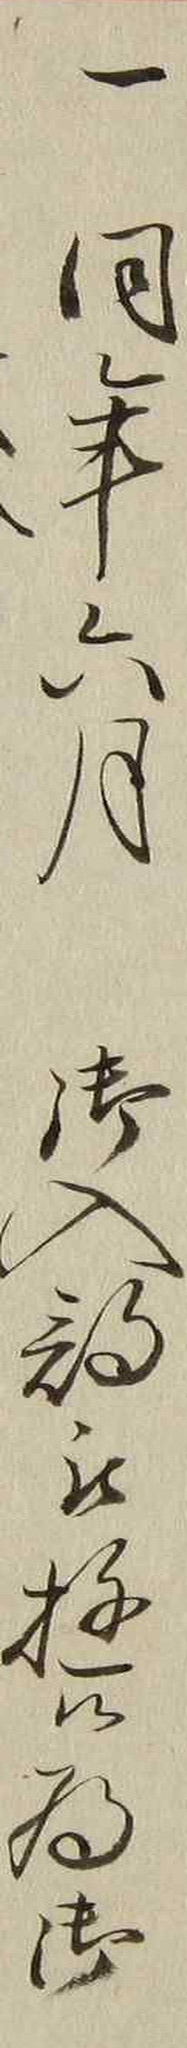一同年六月御入部被遊侯為御
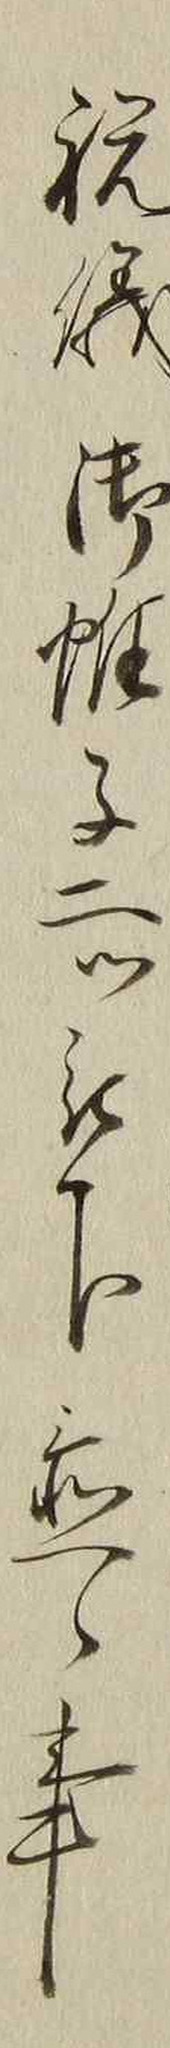祝儀御帷子二つ下置候事
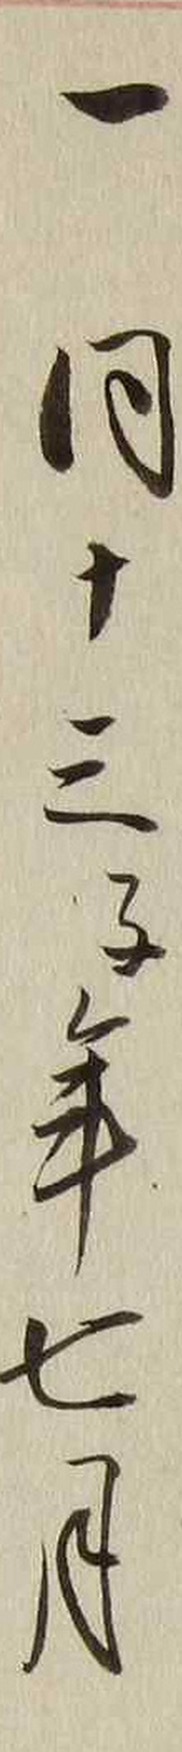一同十三子年七月
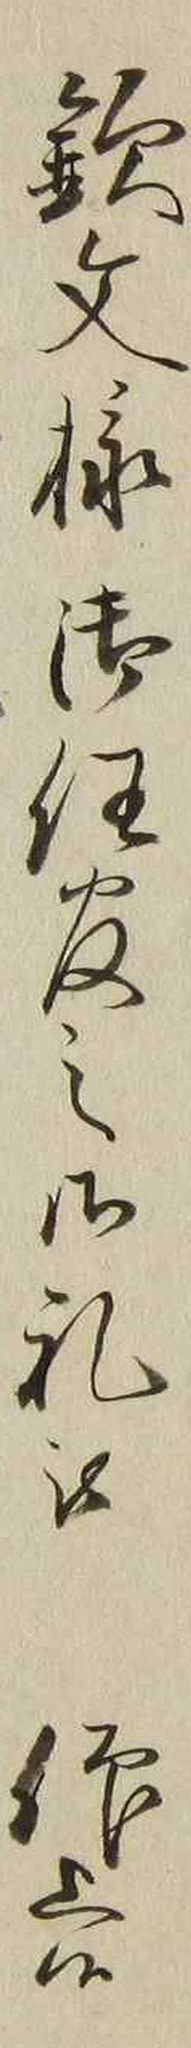欽文様御任官之御礼被仰上候
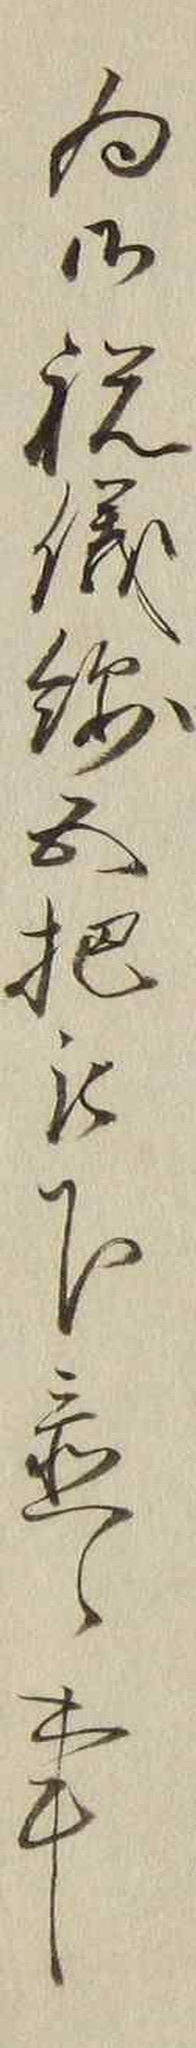為御祝儀綿五把被下置候事
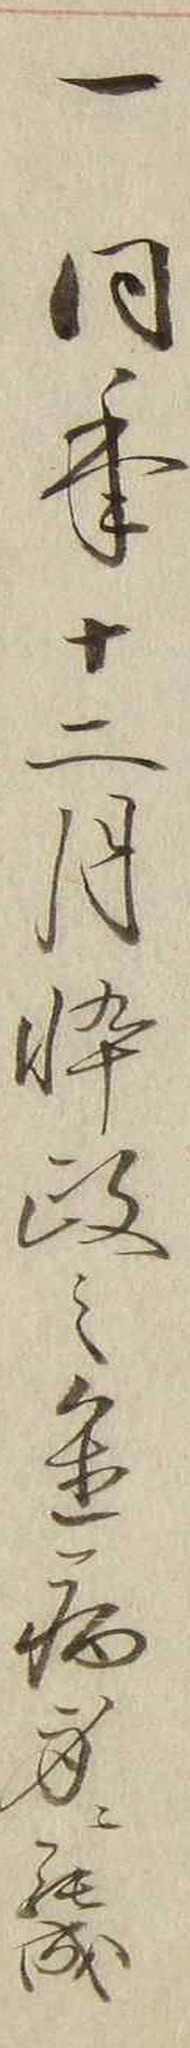一同年十二月忰政之進病身に罷成
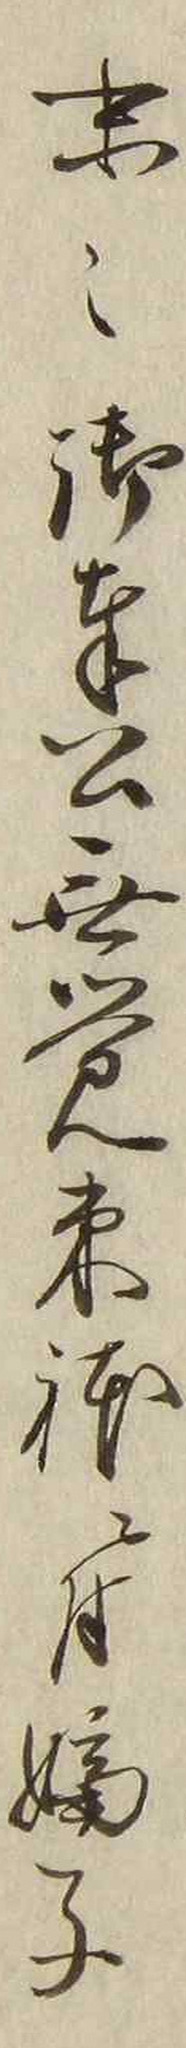末々御奉公無覚東体に付嫡子

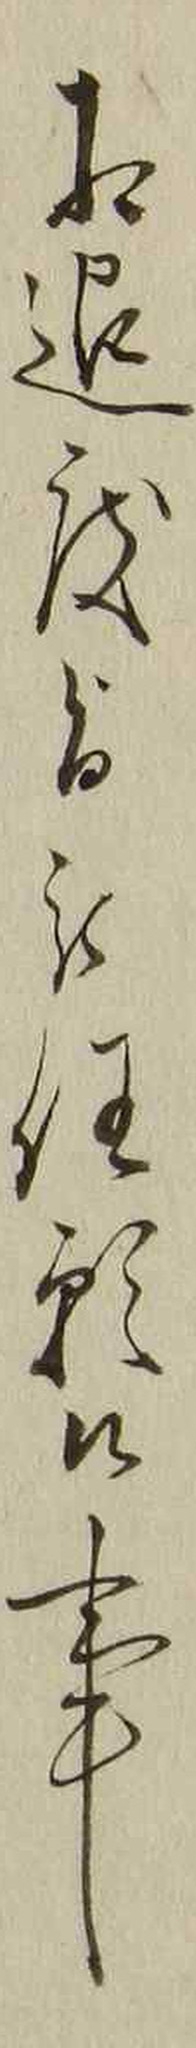相退度旨被任願候事
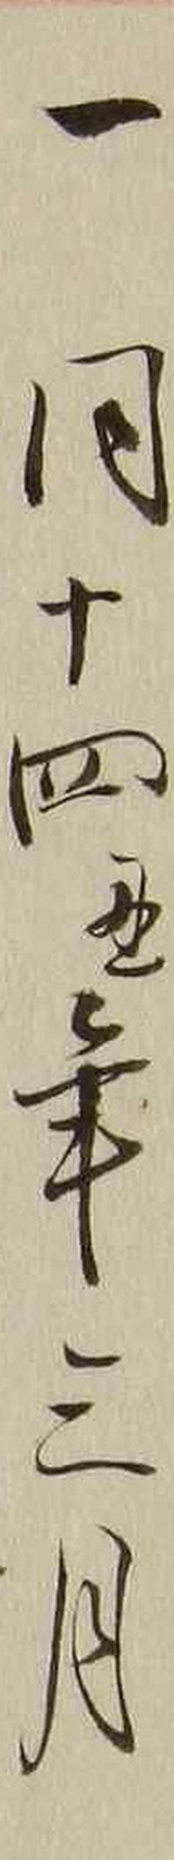一同十四丑年三月
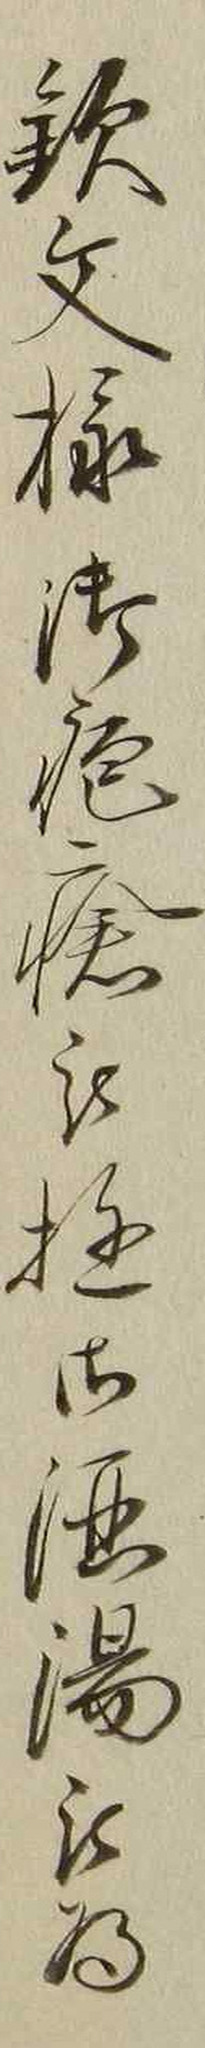欽文様御疱瘡被遊御酒湯被為
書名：諸士系譜　巻之103　か之部11
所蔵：会津若松市立会津図書館
